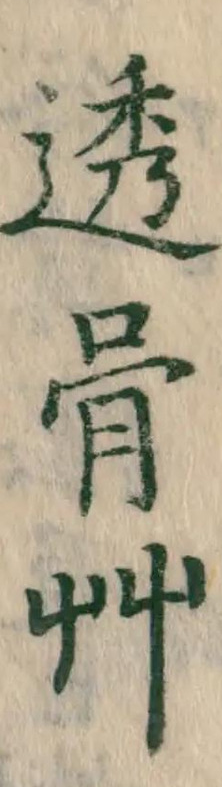透骨艸

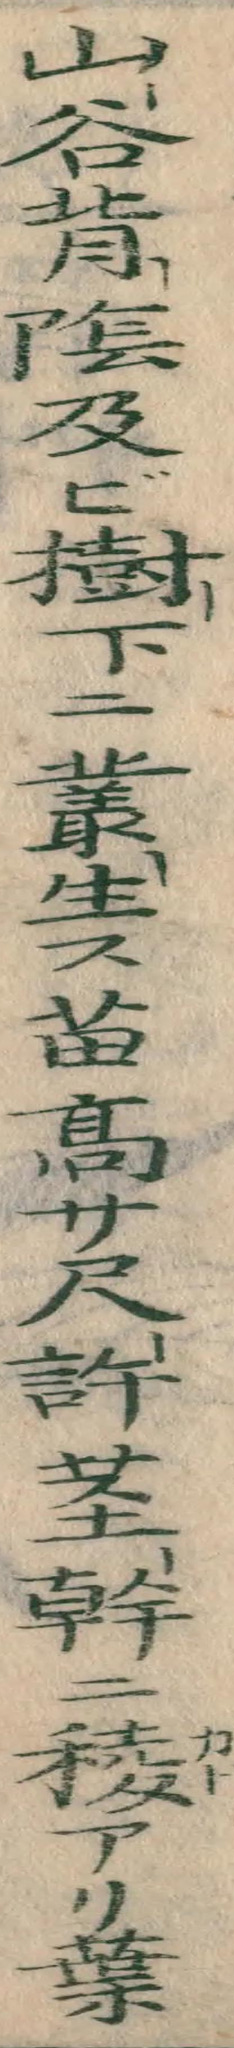山-谷背-陰及ビ樹-下ニ叢-生ス苗高サ尺-許茎-幹ニ稜アリ葉
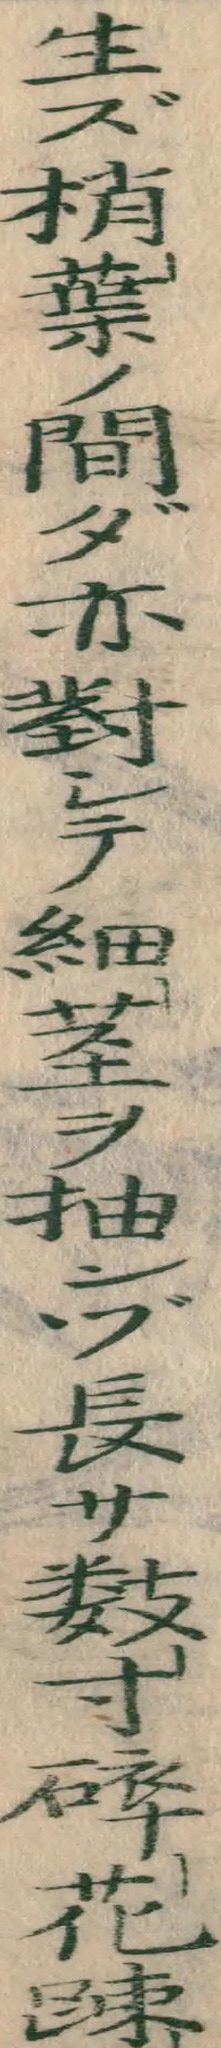生ズ梢-葉ノ間ダ亦対シテ細-茎ヲ抽ンヅ長サ数-寸砕-花疏-
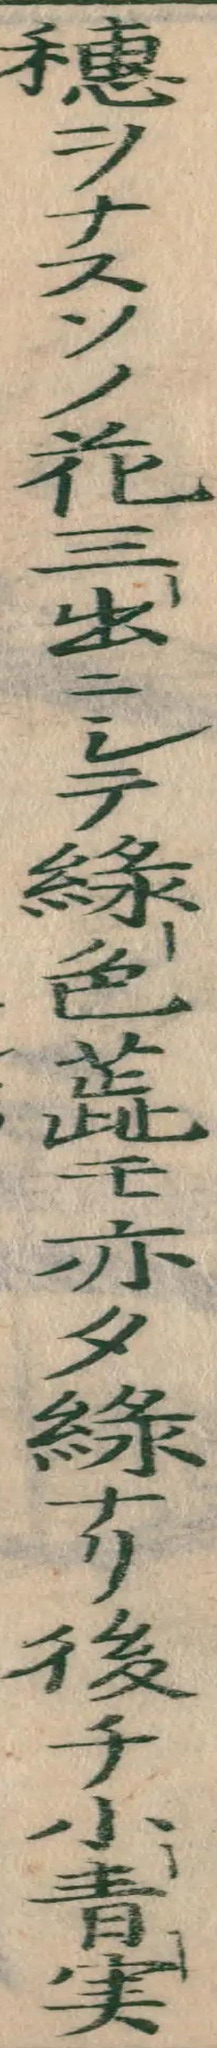穂ヲナスソノ花三-出ニシテ緑-色蕊モ亦タ緑ナリ後チ小-青-実
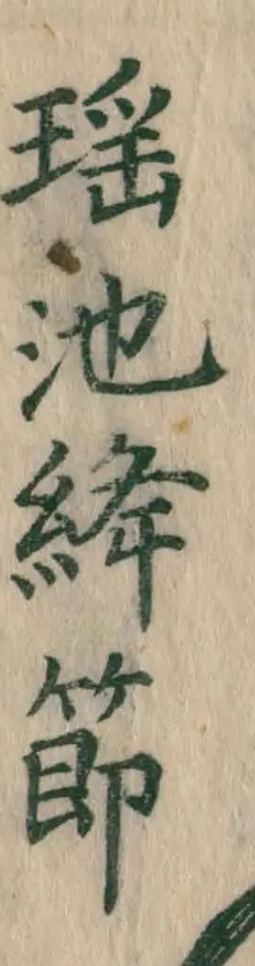瑶池絳節

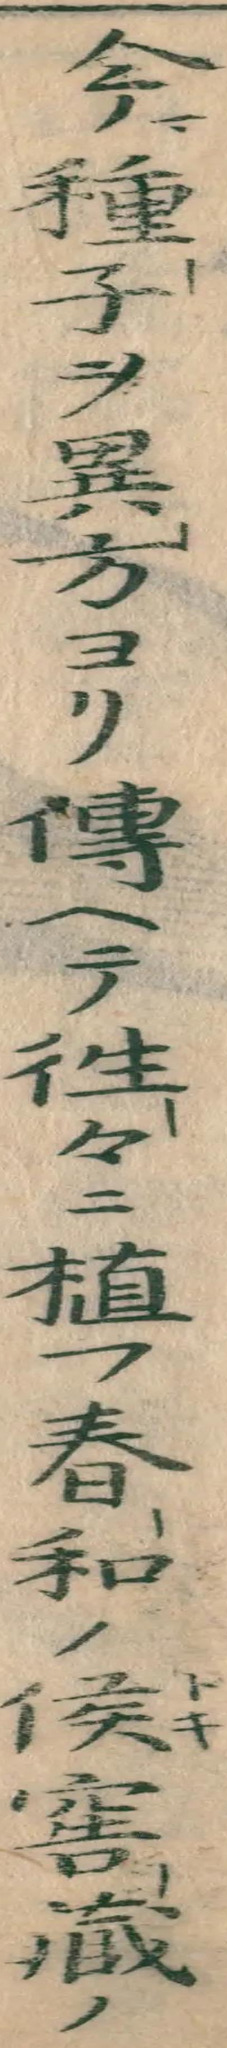今種-子ヲ異-方ヨリ伝ヘテ往-々ニ植フ春-和ノ侯窖-蔵ノ
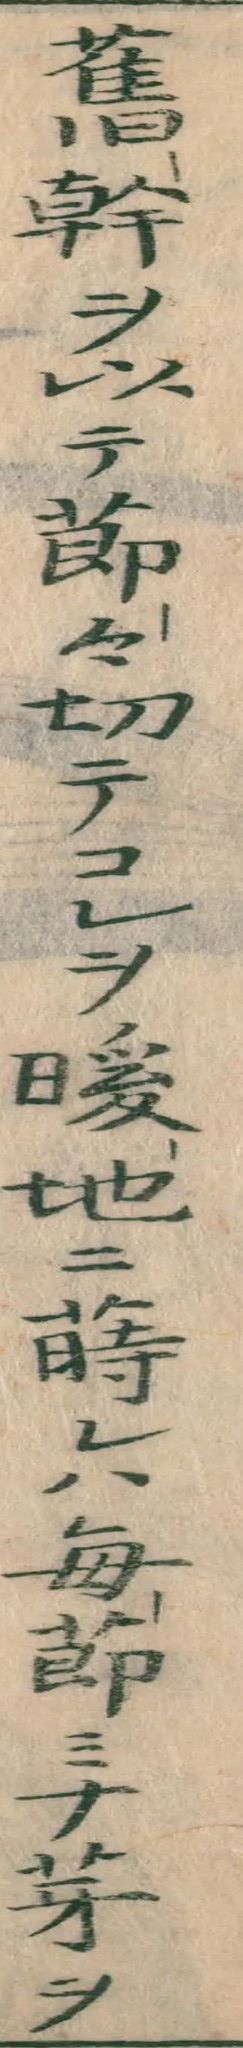旧-幹ヲ以テ節-々切テコレヲ暖-地ニ蒔レハ毎-節ミナ芽ヲ
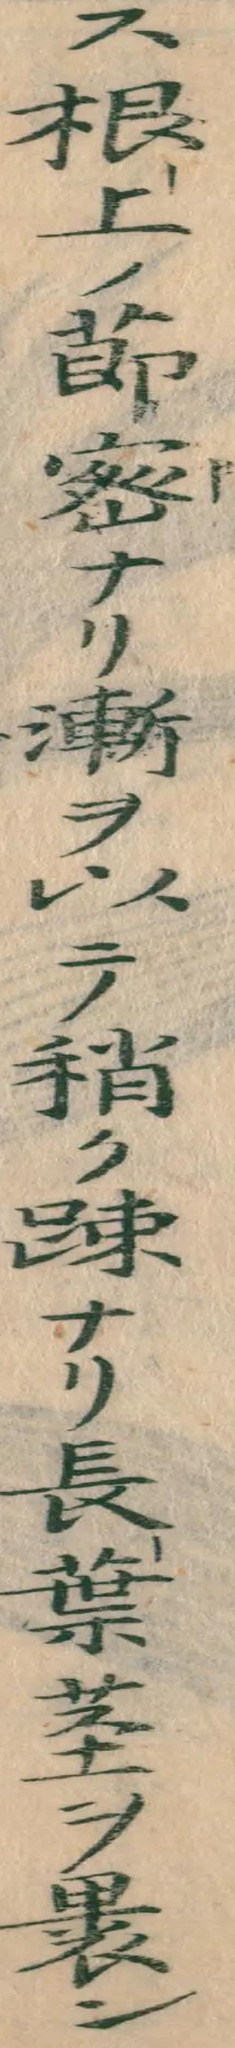ス根-上ノ節密ナリ漸ヲ以テ稍ク疏ナリ長-葉茎ヲ褁ン
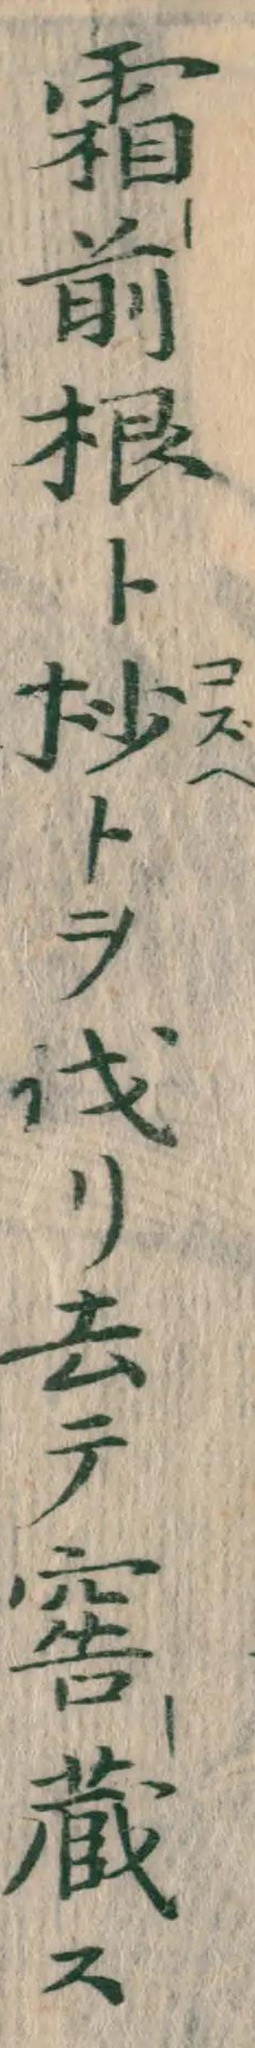霜-前根トトヲリ去テ窖-蔵ス
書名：花彙 草部4巻木部4巻. [1]
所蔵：国立国会図書館 National Diet Library, JAPAN
